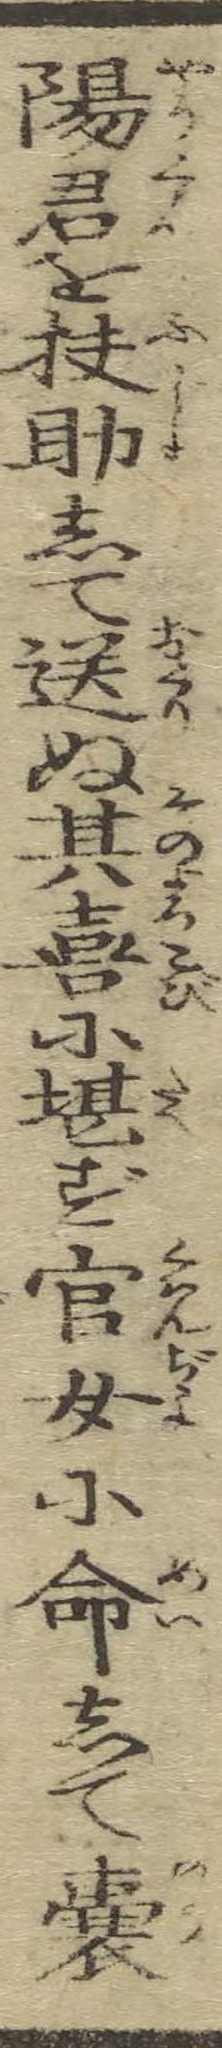陽君を扶助して送ぬ其喜に堪ず官女に命して嚢
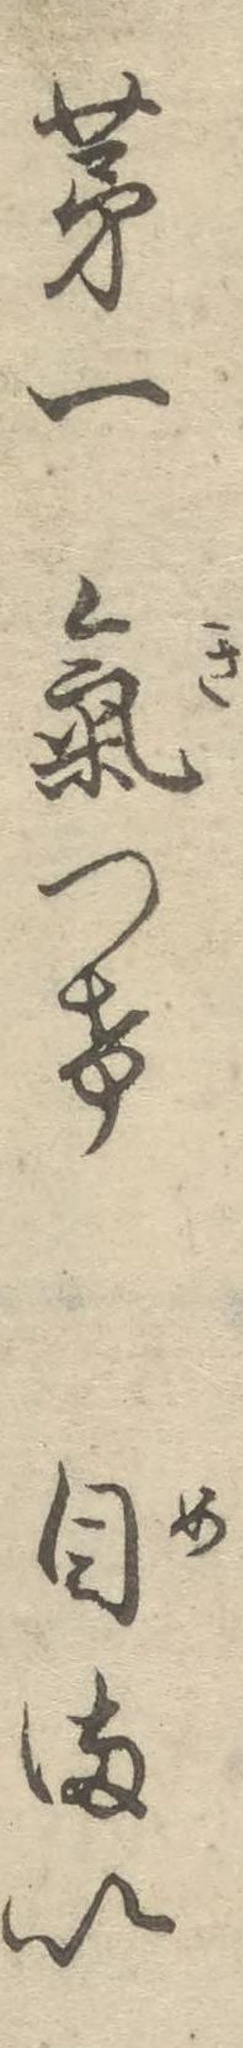第一気つけ目まい
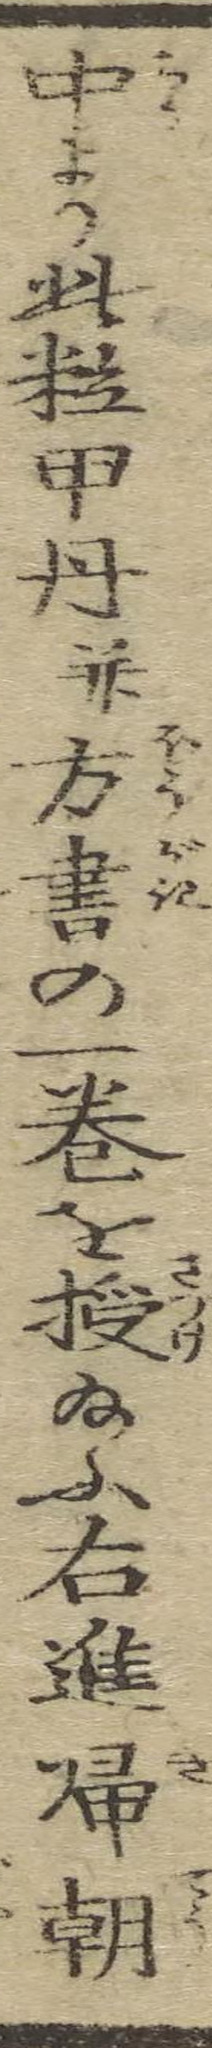中より此粒甲丹并方書の一巻を授給ふ右進帰朝
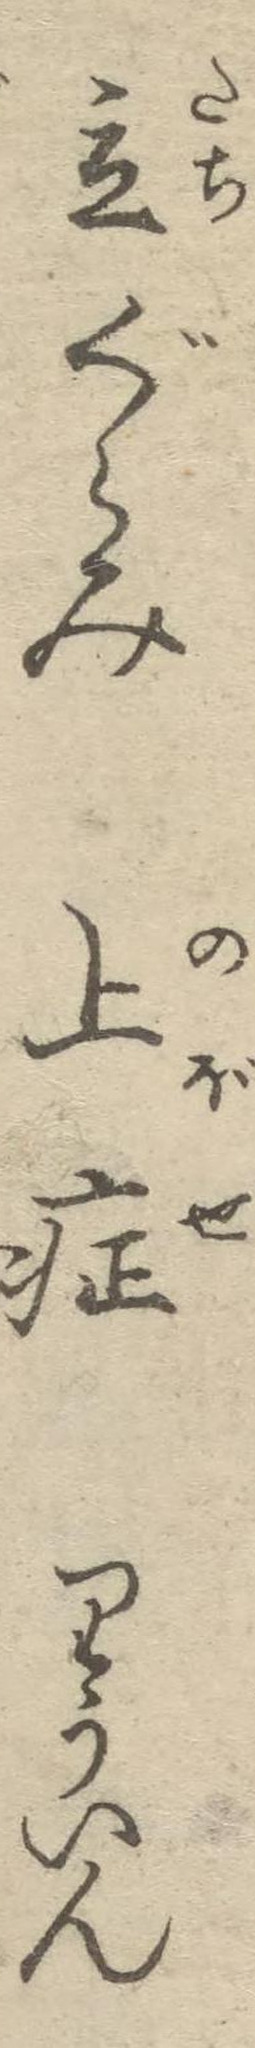立ぐらみ上症りういん
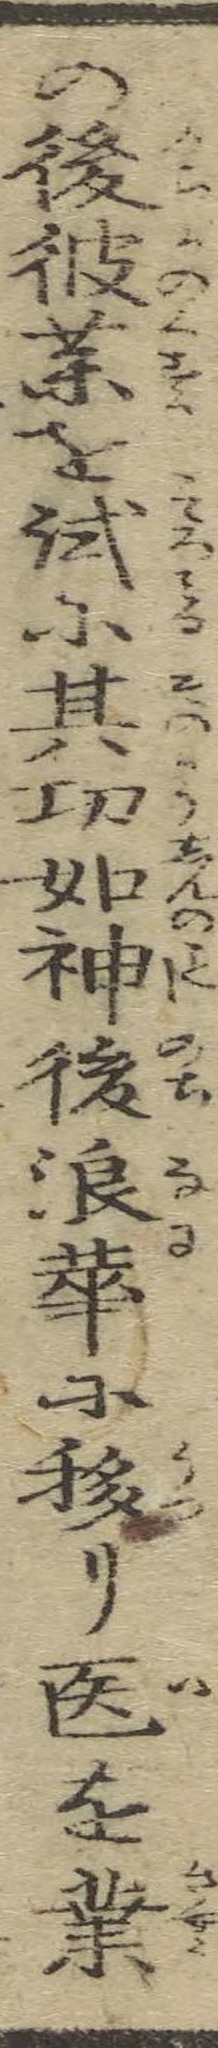の後彼薬を試に其功如神後浪華に移り医を業
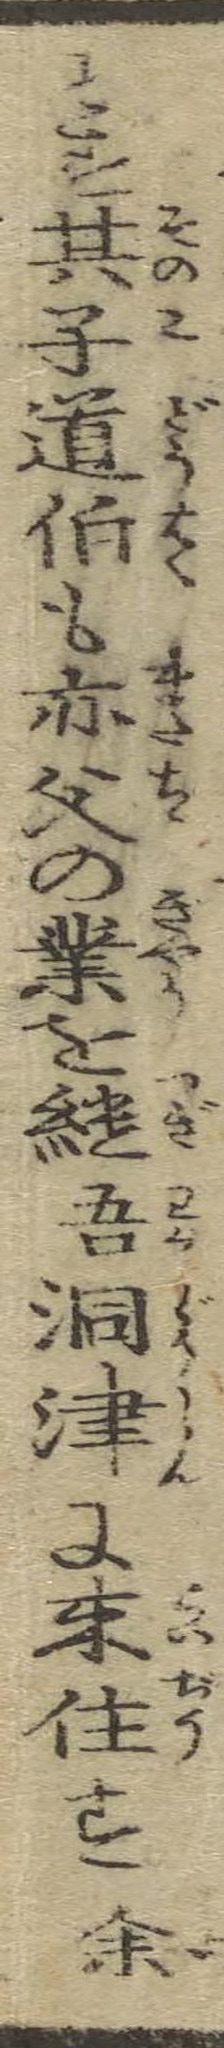とす其子道伯も亦父の業を継吾洞津に来住す余
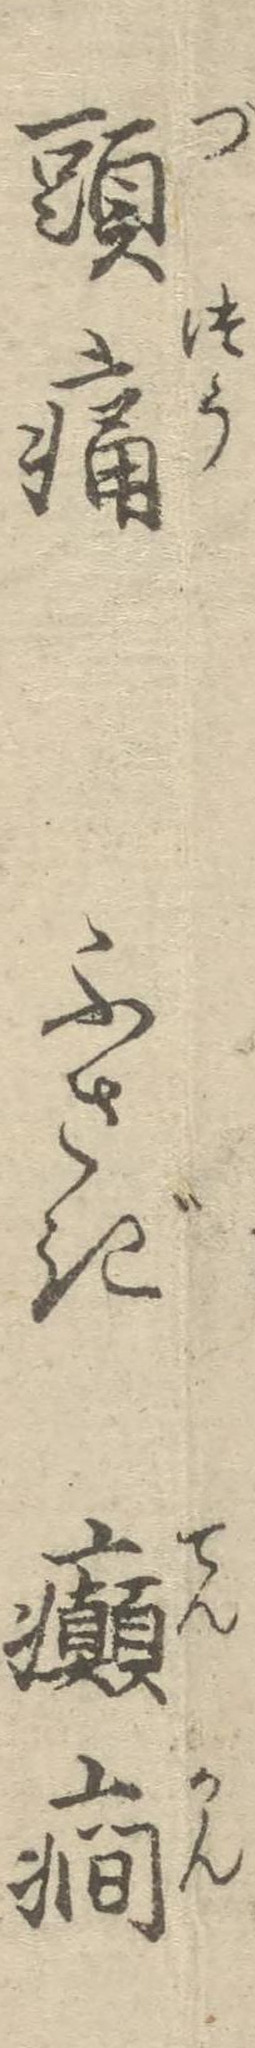頭痛ふさぎ癲癇
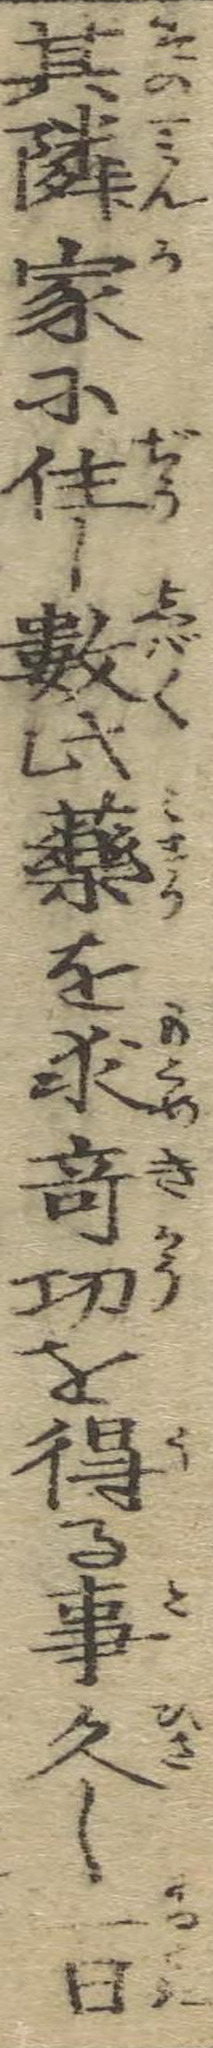其隣家に住し数此薬を求奇功を得る事久し一日
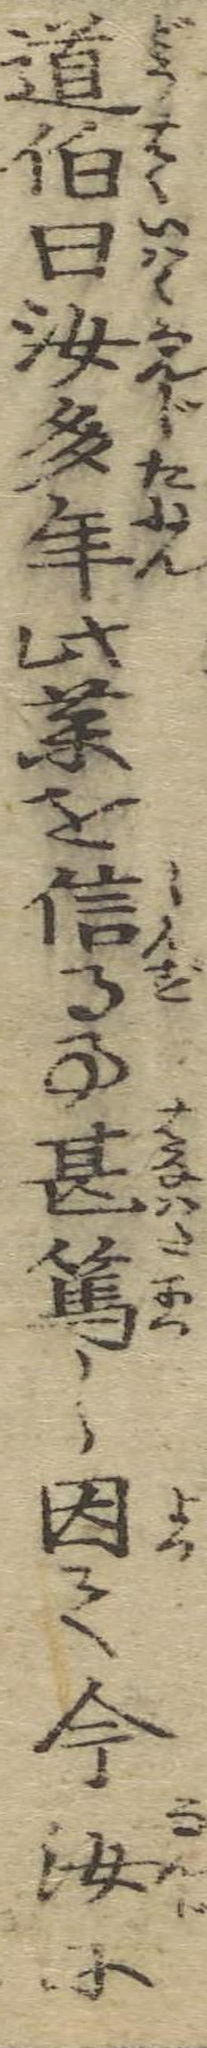道伯曰汝多年此薬を信る事甚篤し因て今汝に
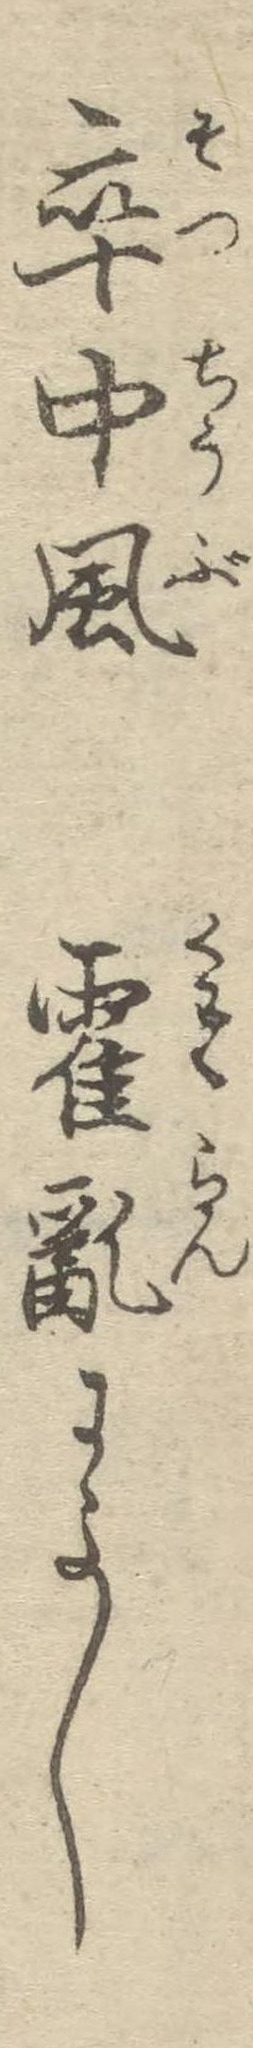卒中風霍乱によし
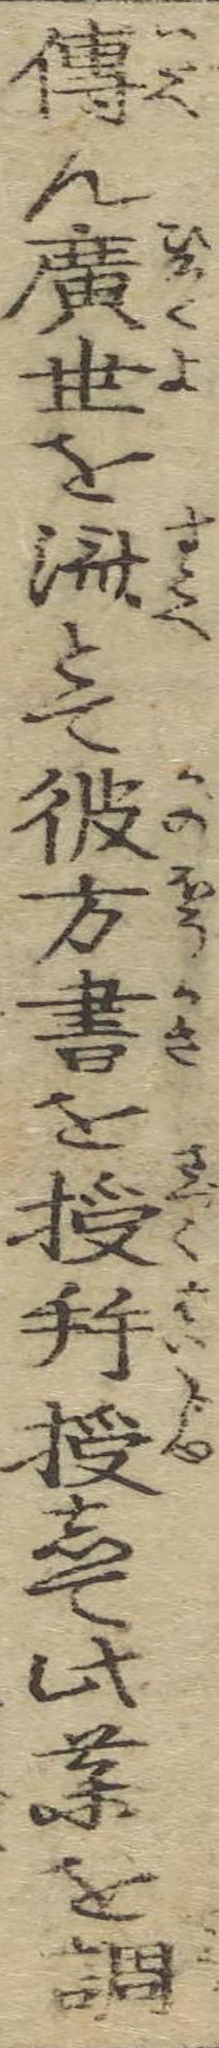傳ん広世を済とて彼方書を授拝授して此薬を調
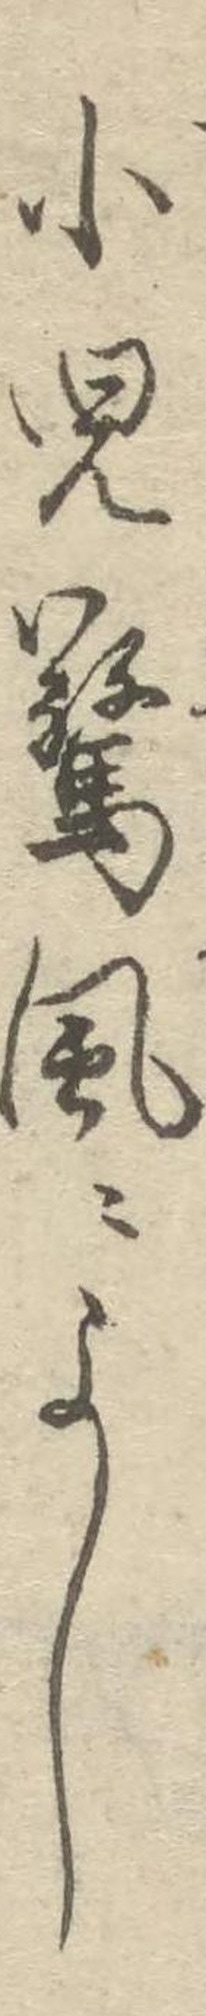小児驚風によし
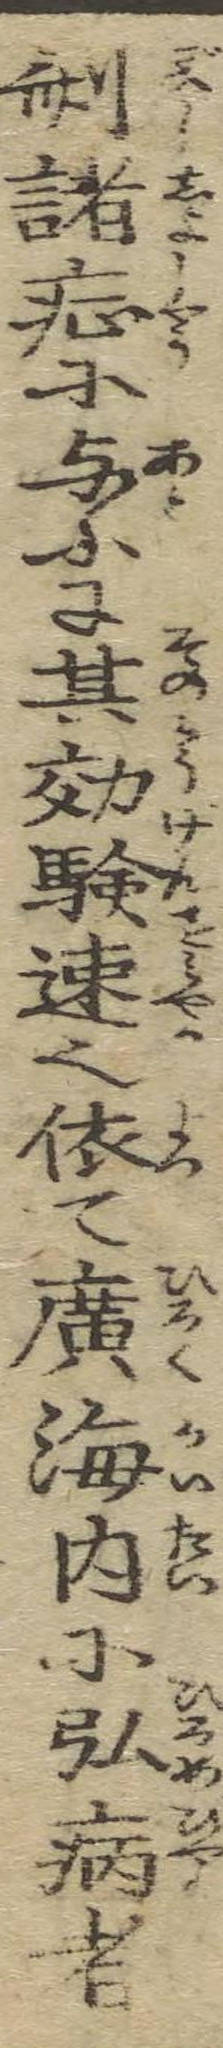劑諸症に与ふに其効験速也依て広海内に弘病者
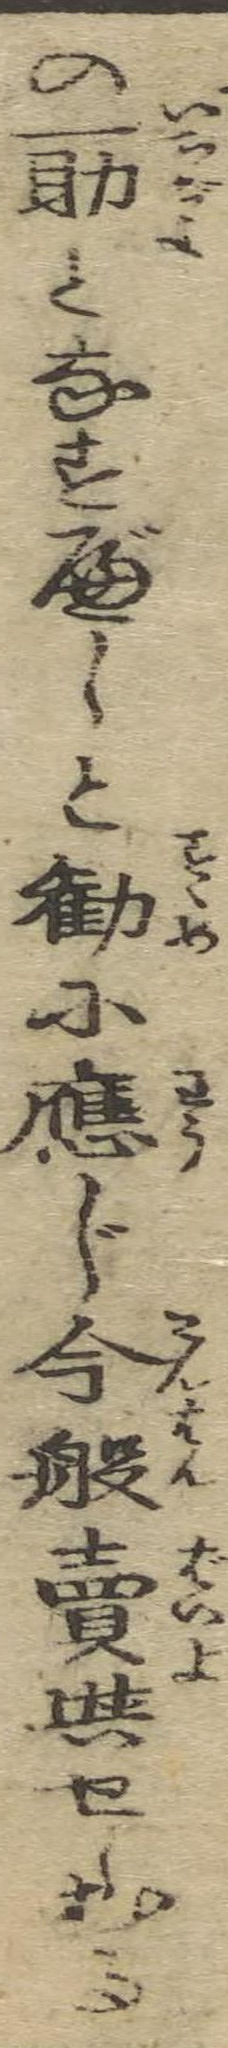の一助となすべしと勧に応じ今般売與せしむる
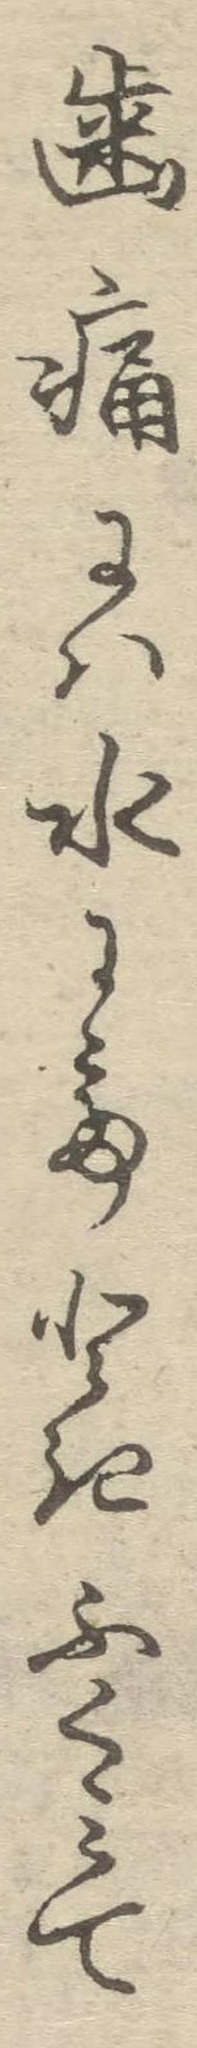歯痛には水にてときふくみて
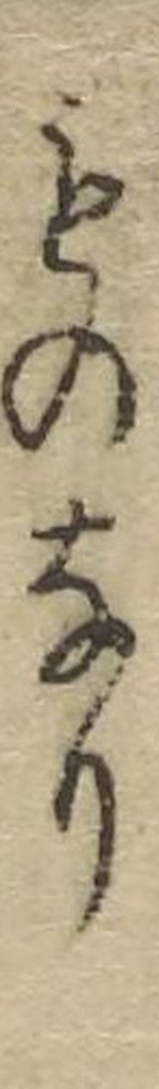ものなり
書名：浪華薬種問屋能書張交帖. 二
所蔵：国立国会図書館 National Diet Library, JAPAN
